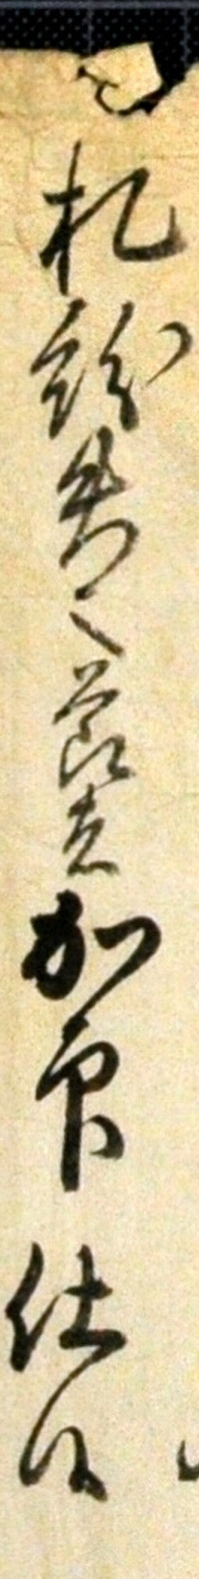札紛失之節は加印仕候
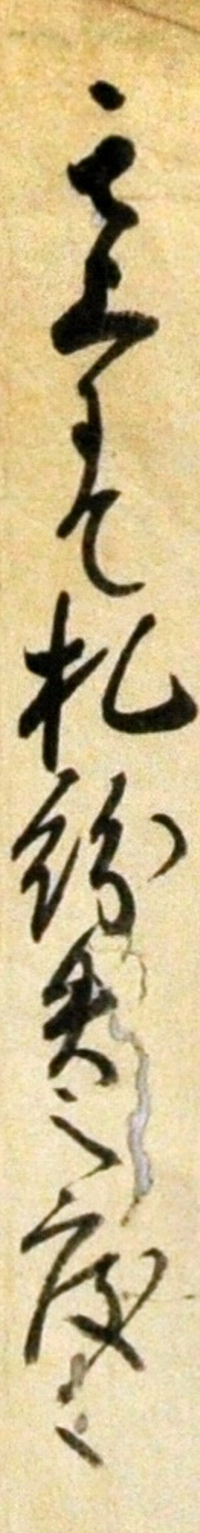其上にて札紛失之度々
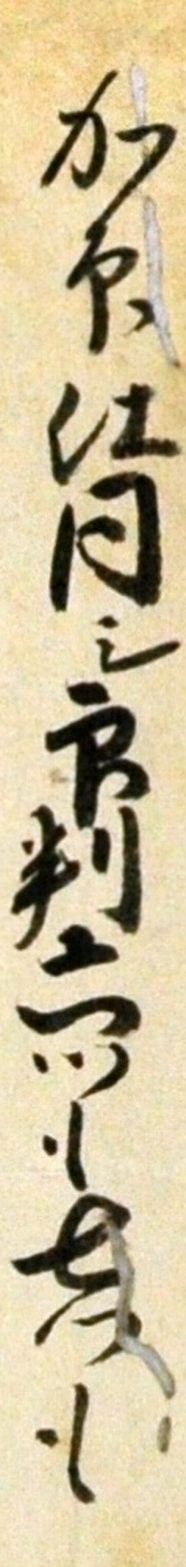加印仕同シ印判六ツも七ツも
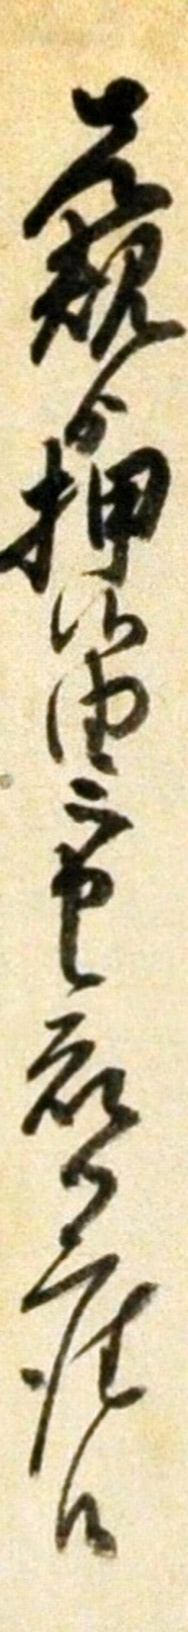先規ゟ押候由に申候衆御座候
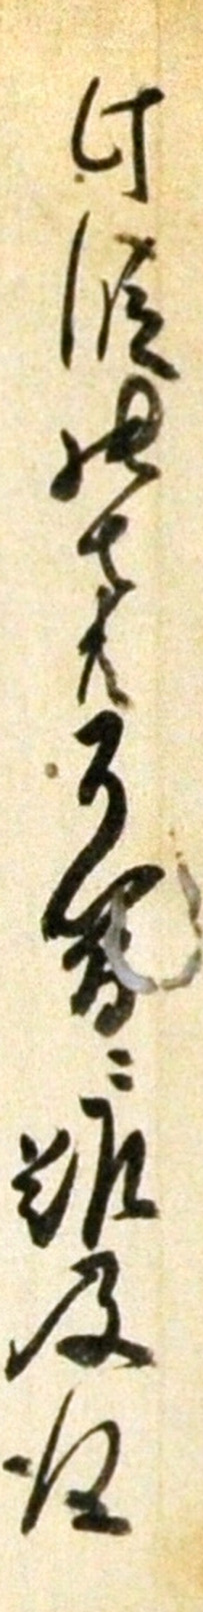此段能者共了簡に難及儀
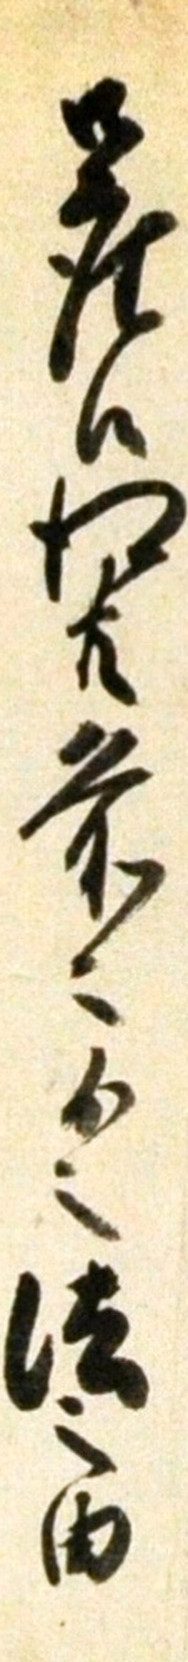御座候得共前々ゟ之法之由
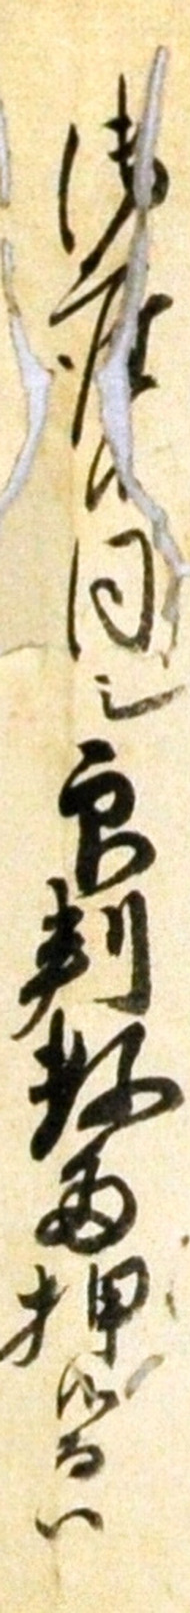御座候同シ印判数多押候ては
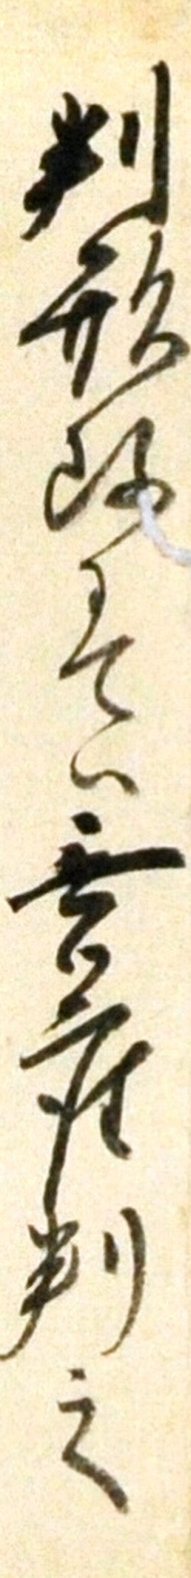判形改にては無御座判之
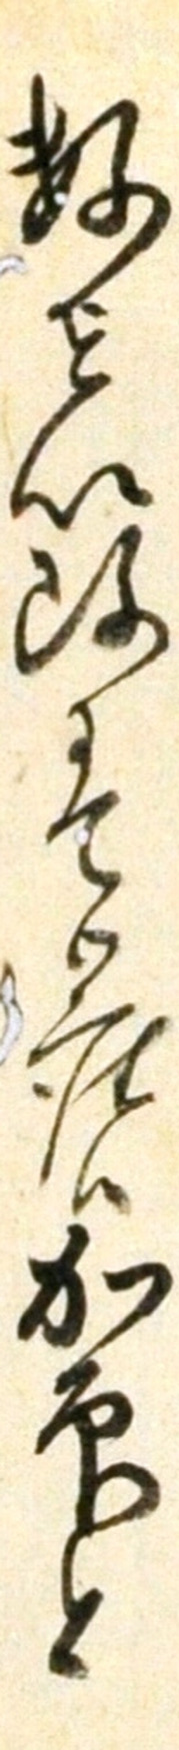数を以改にて御座候加印と
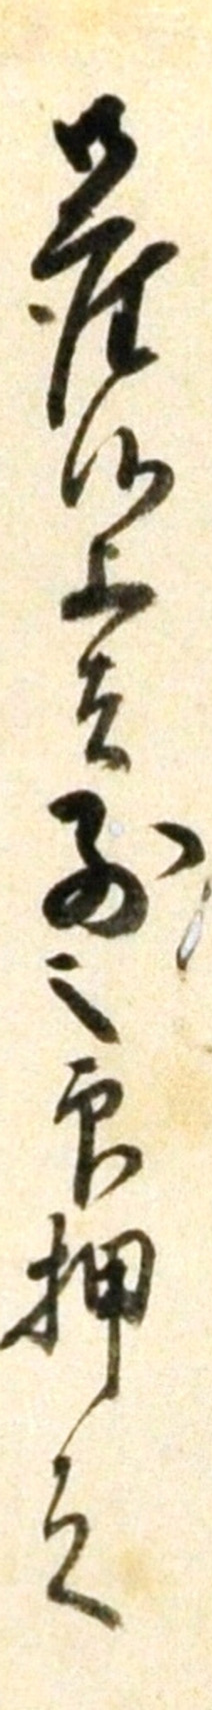御座候上は別之印押之
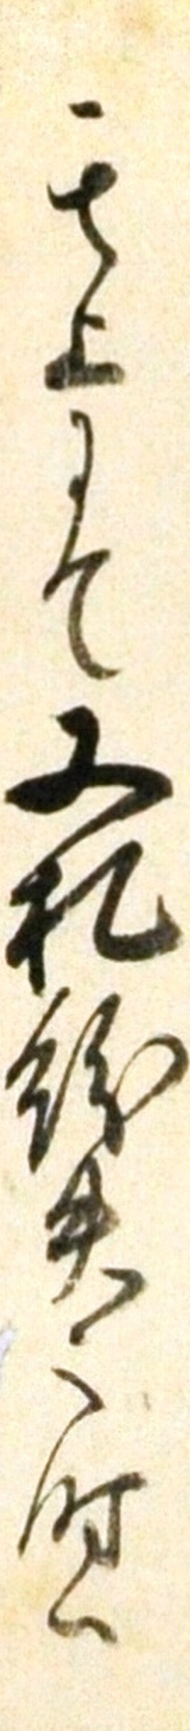其上にて又札紛失之時は
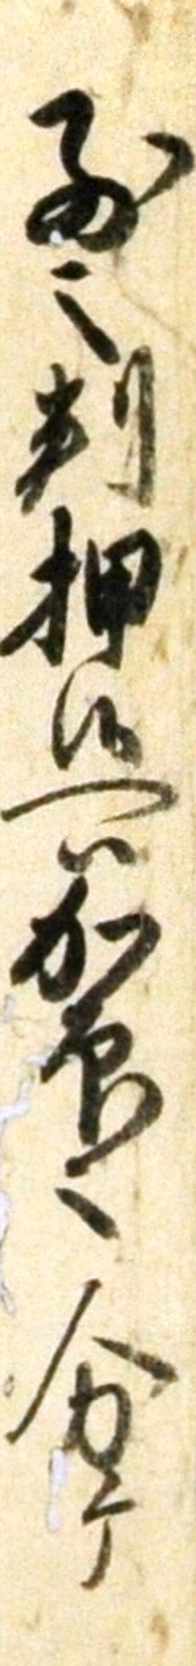別之判押候へは加印之分ケ
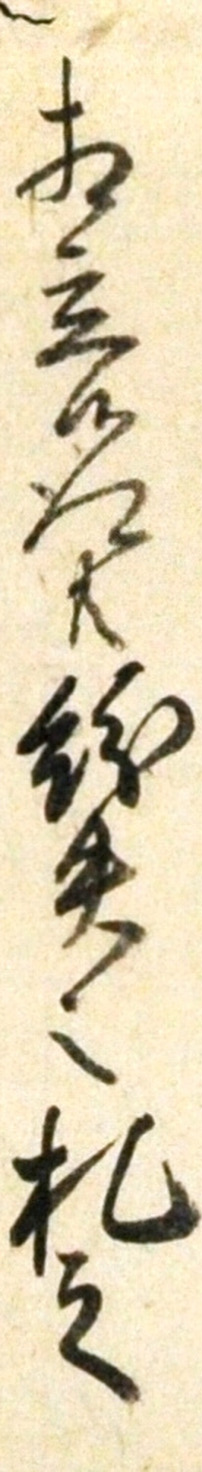相立候得共紛失之札之
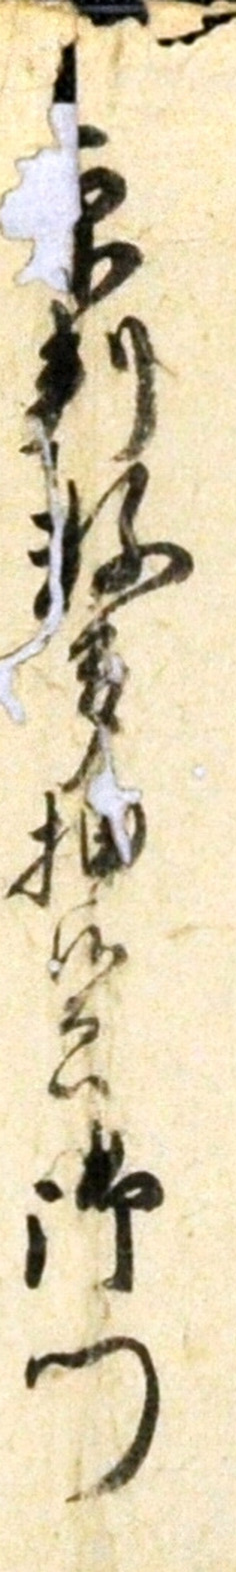印形数多押候ては御門
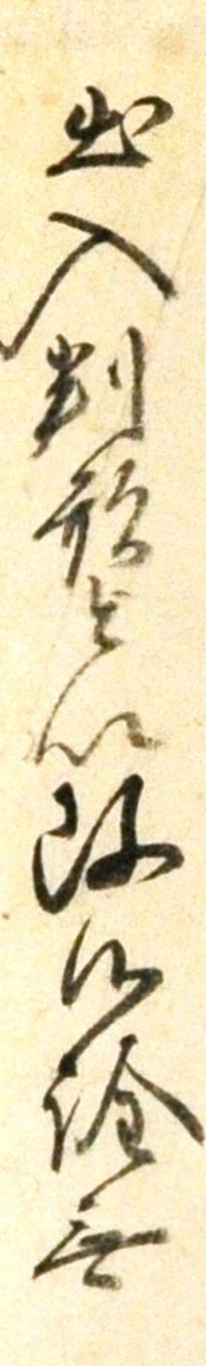出入判形を以改候詮無
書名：書状
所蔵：伊那市立高遠町図書館・合同会社AMANE
